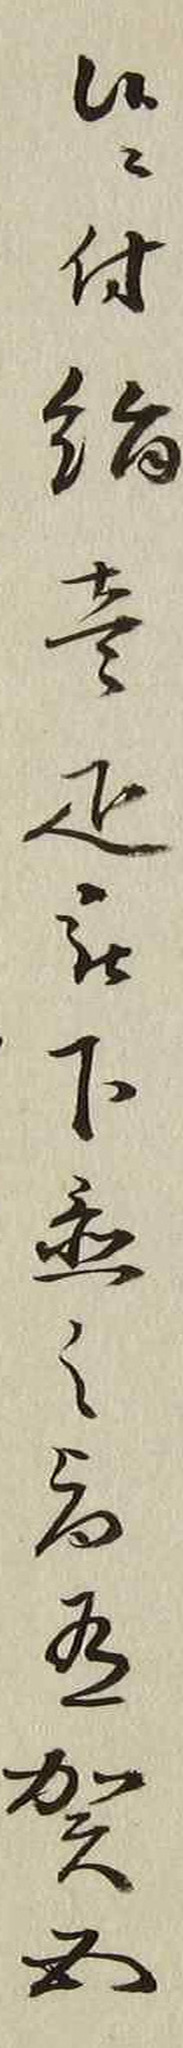候ニ付絹壱疋被下置候旨有賀五
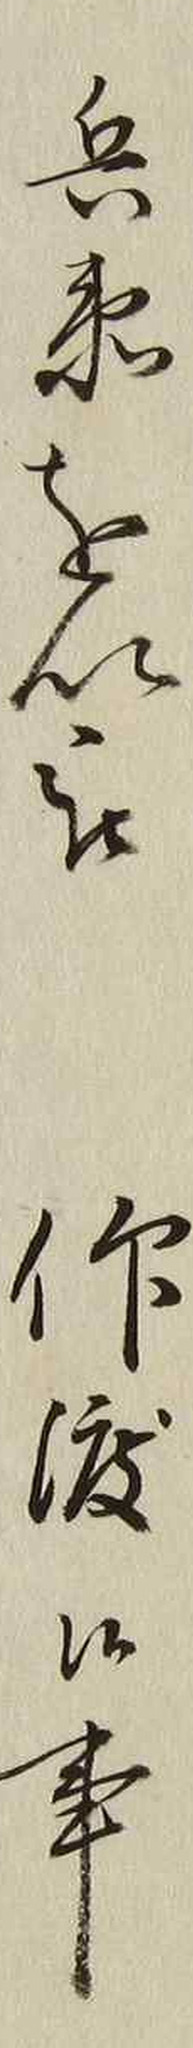兵衛を以被仰渡候事
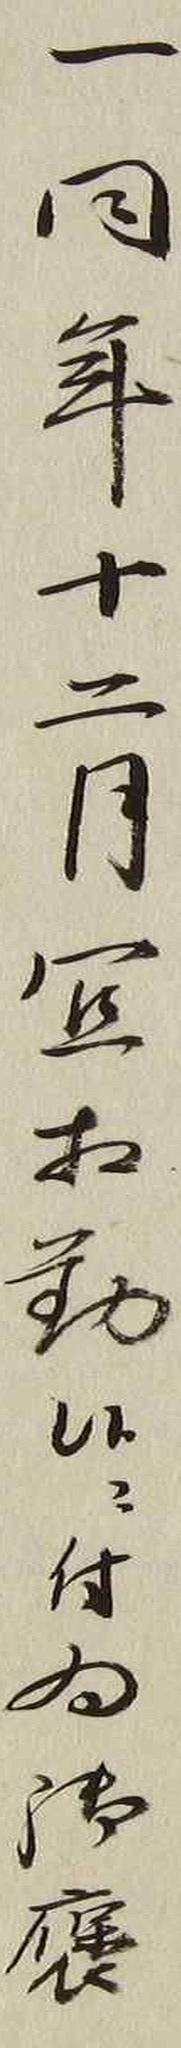一同年十二月宜相勤候ニ付為御褒
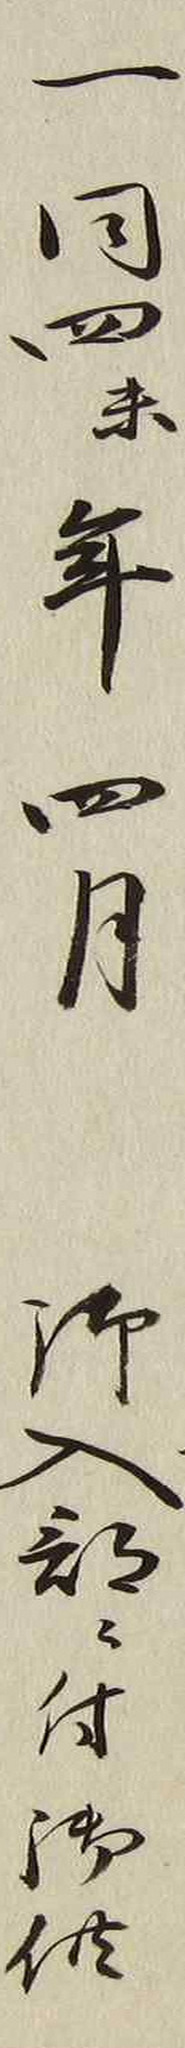一同四未年四月御入部二付御供
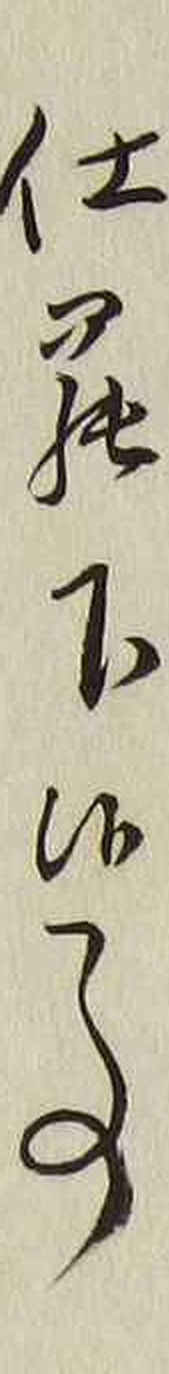仕罷下候事
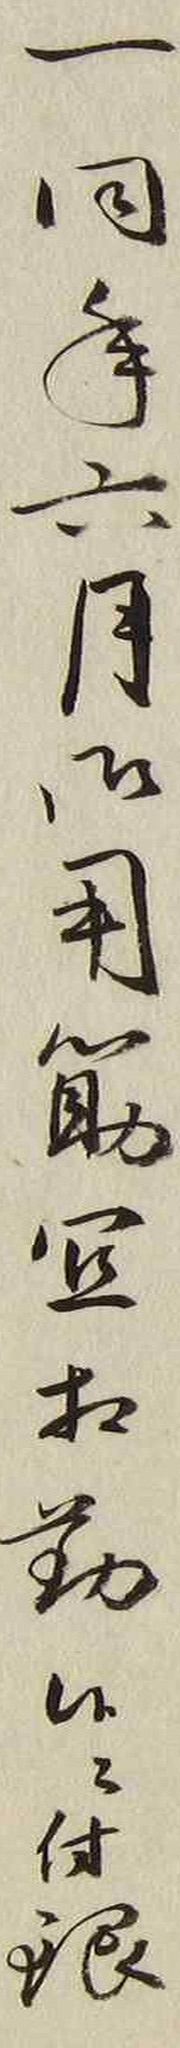一同年六月御用筋宜相勤候ニ付銀
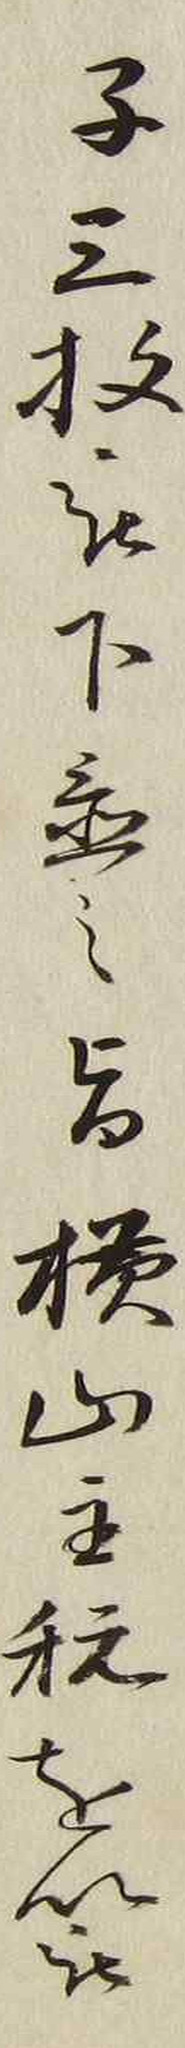子三枚被下置候旨横山主税を以被

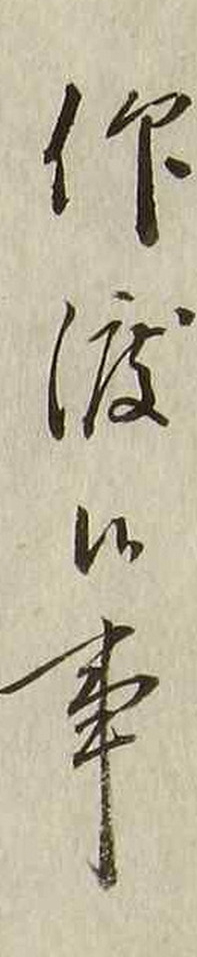仰渡候事
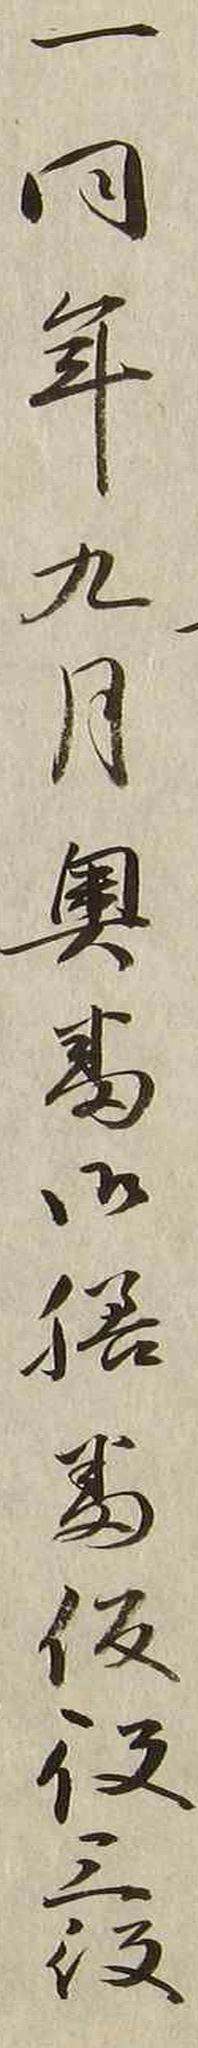一同年九月奥番御膳番仮役三役
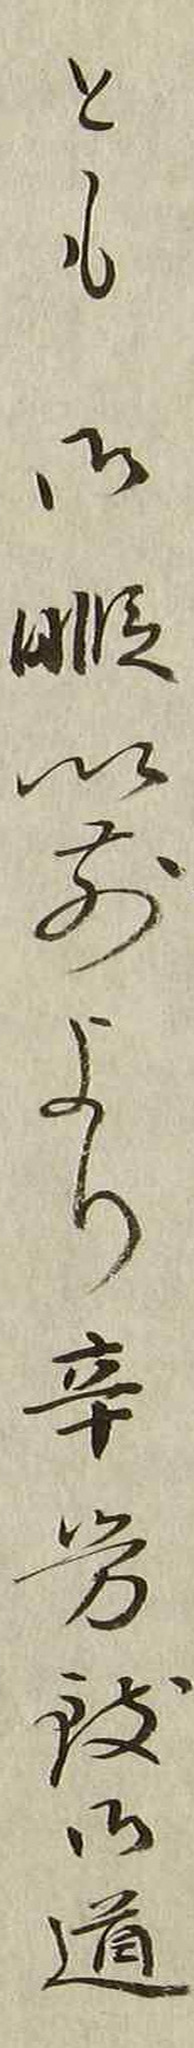とも御暇以前より辛労致御道
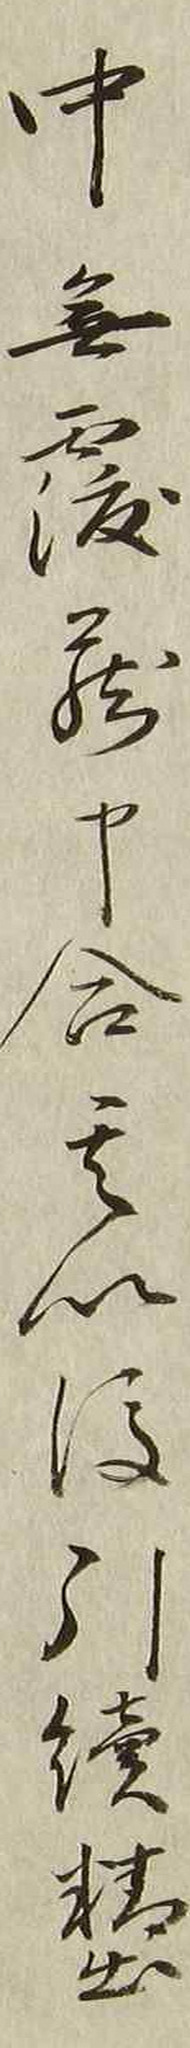中無覆蔵申合其以後引続精出
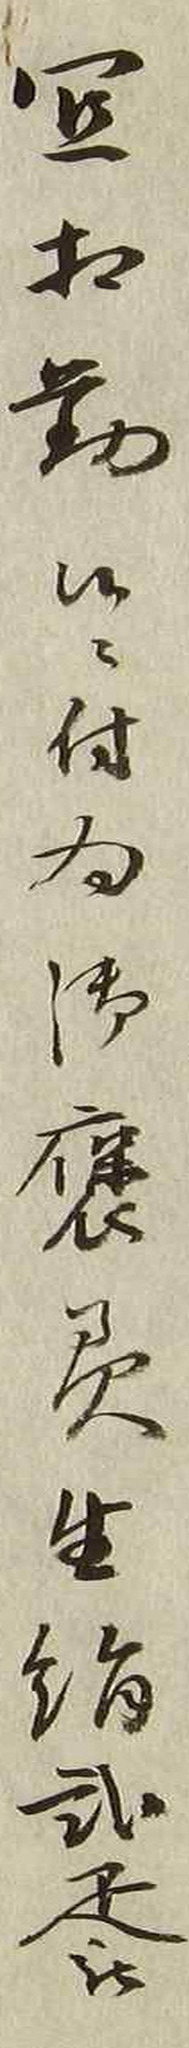宜相勤候ニ付為御褒美生絹弐疋被
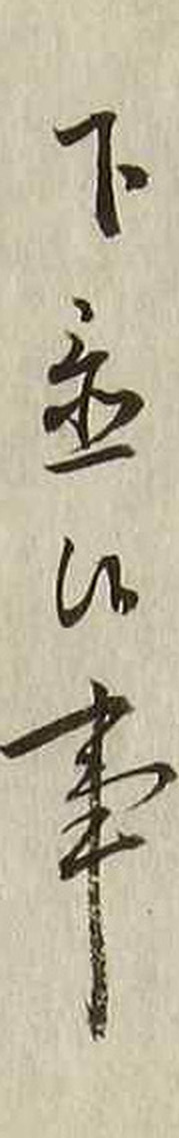下置候事
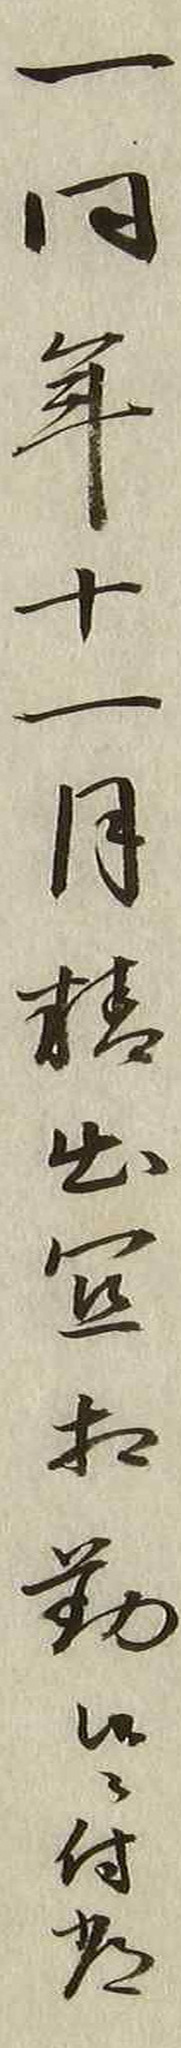一同年十一月精出宜相勤候ニ付常
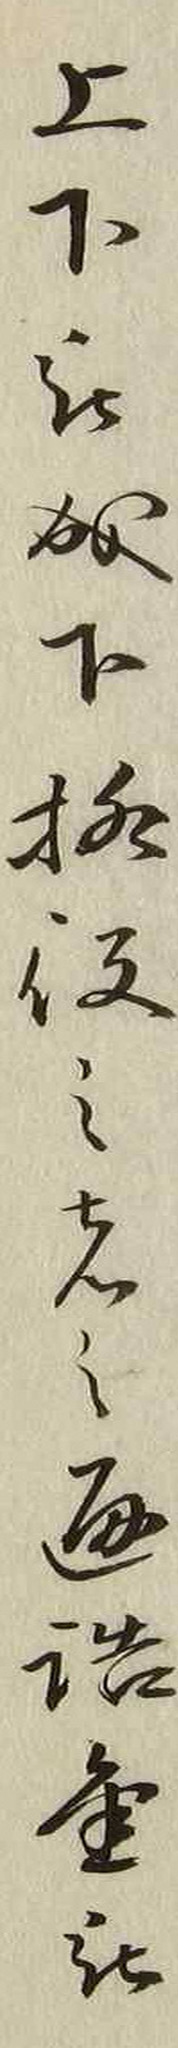上下被成下格役之者之通詰番被
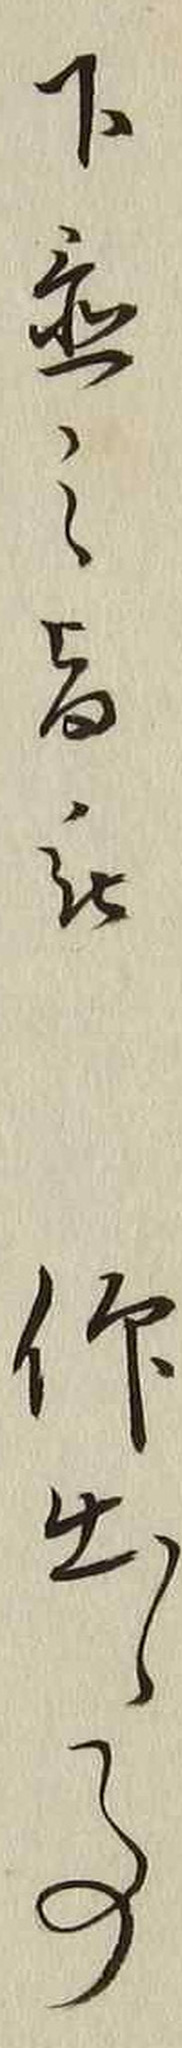下置候旨被仰出候事
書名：諸士系譜　巻之19　い之部19
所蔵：会津若松市立会津図書館
